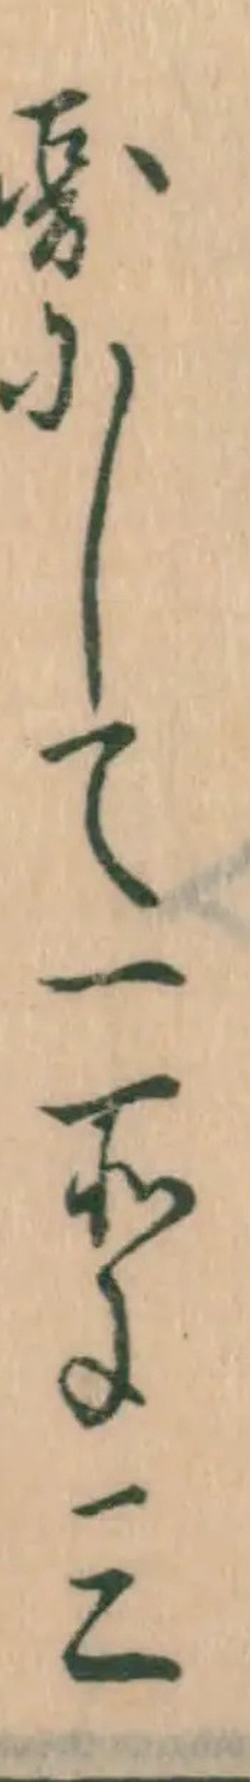図にして一所に三
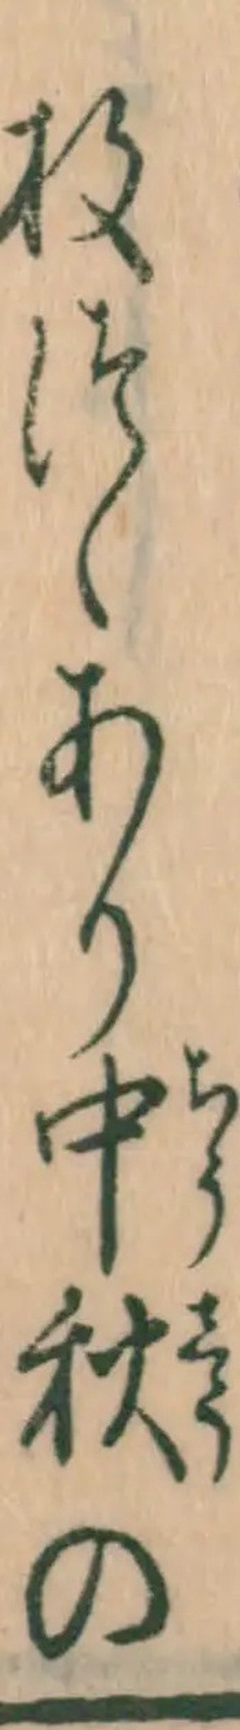枝つゝあり中秋の
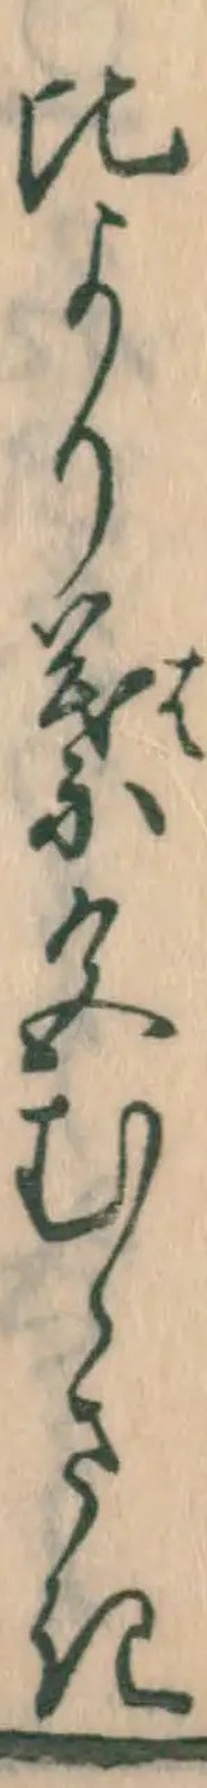頃より葉色むらさき
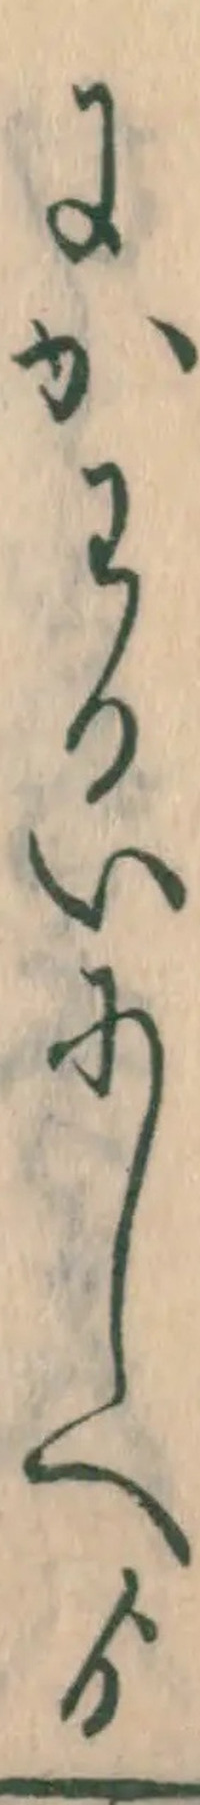にかわるいにしへゟ
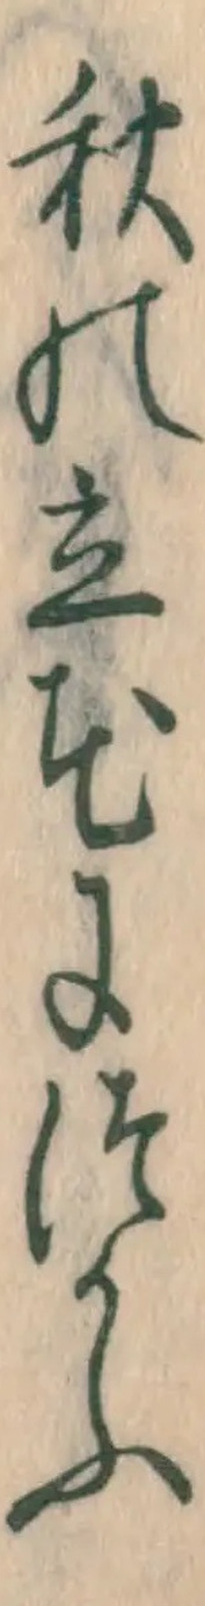秋の立花につかふ
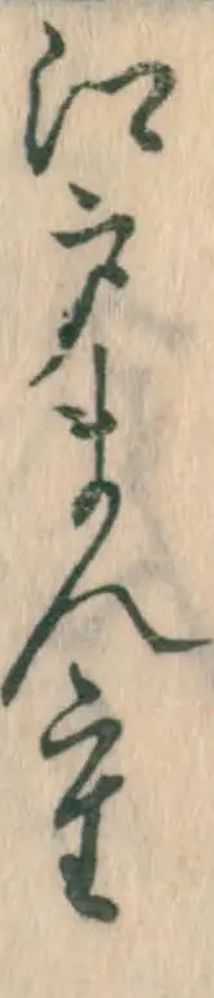江戸まん重
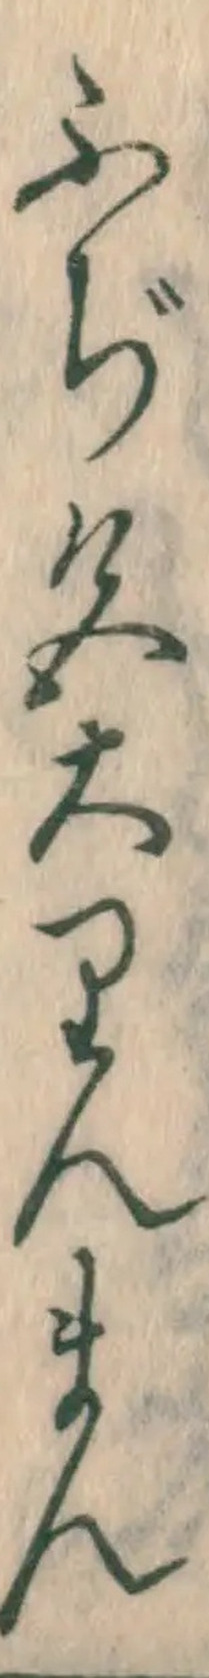ふぢ色大りんまん
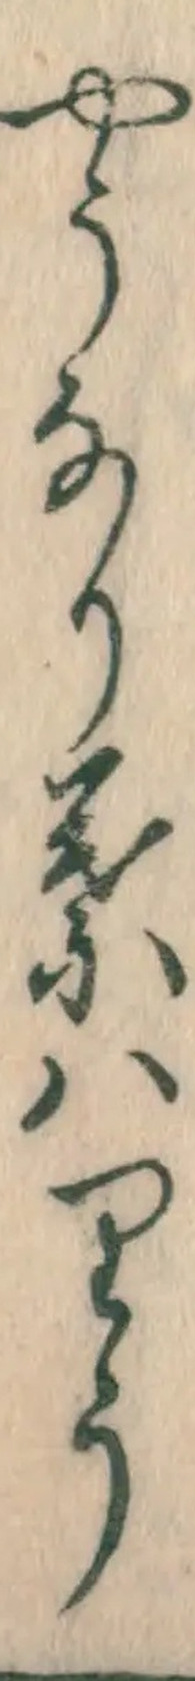やうなり葉はりう
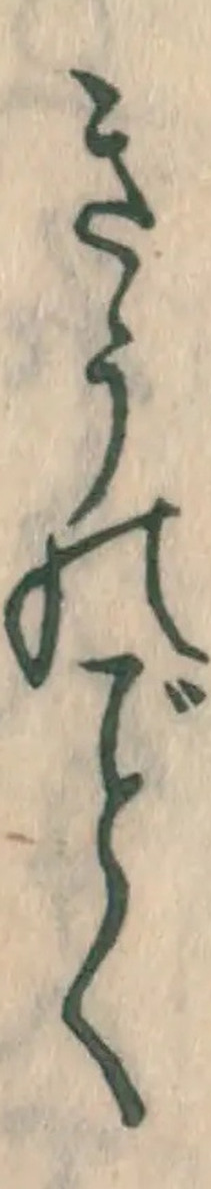きうのごとく

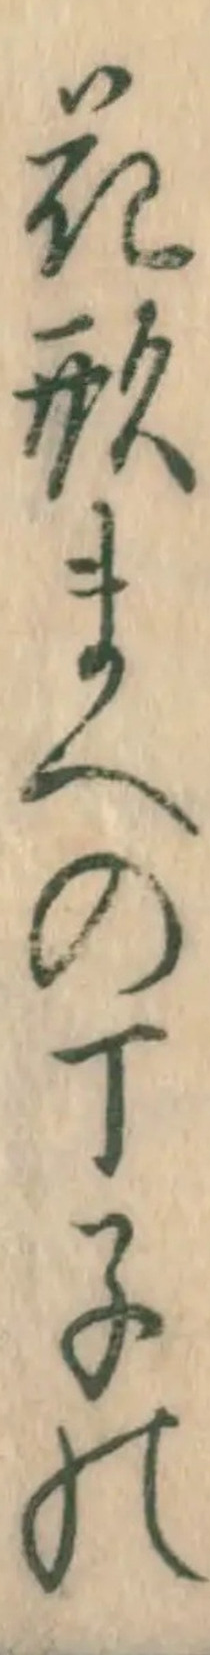花形まへの丁子の
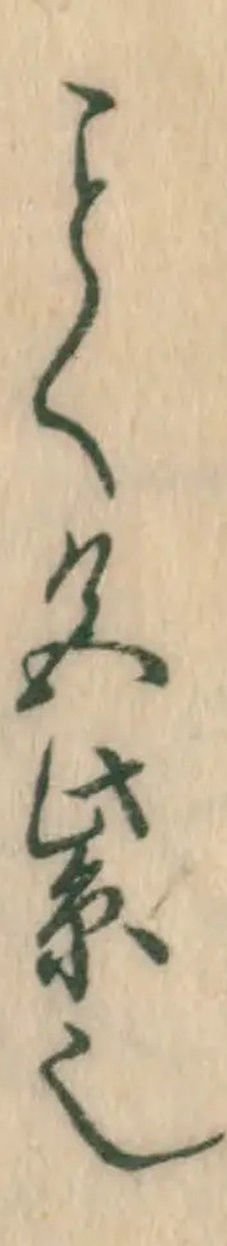ことく色紫也
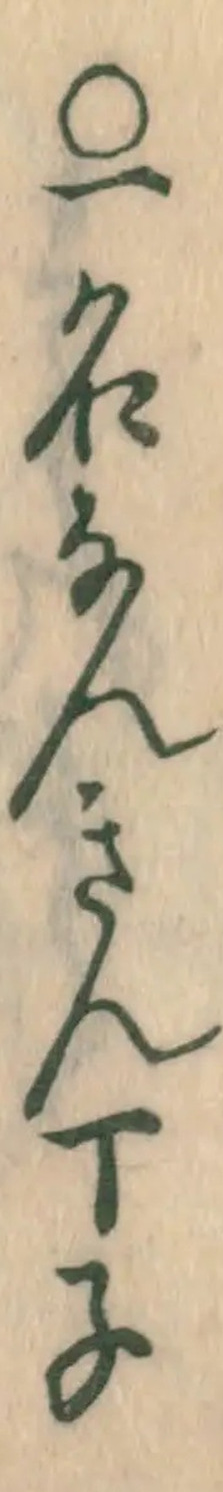○一名なんきん丁子
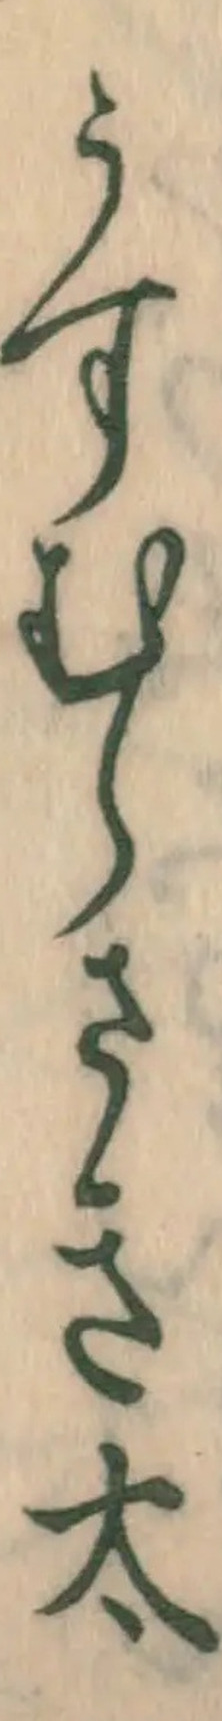うすむらさき太
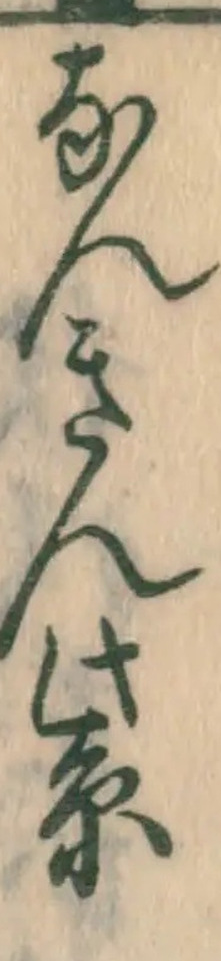なんきん紫
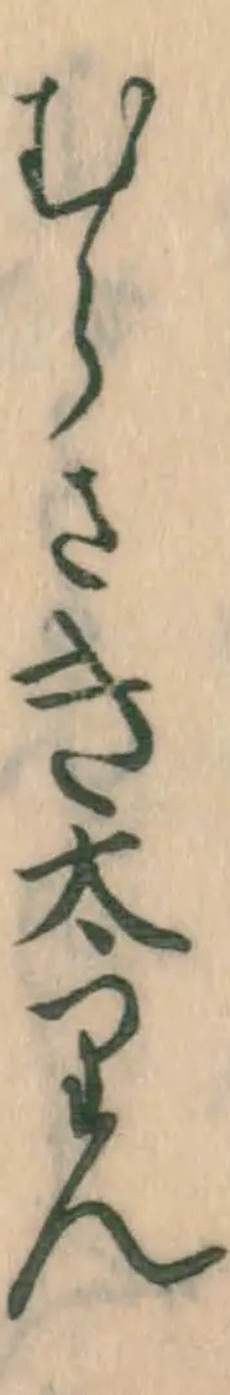むらさき太りん
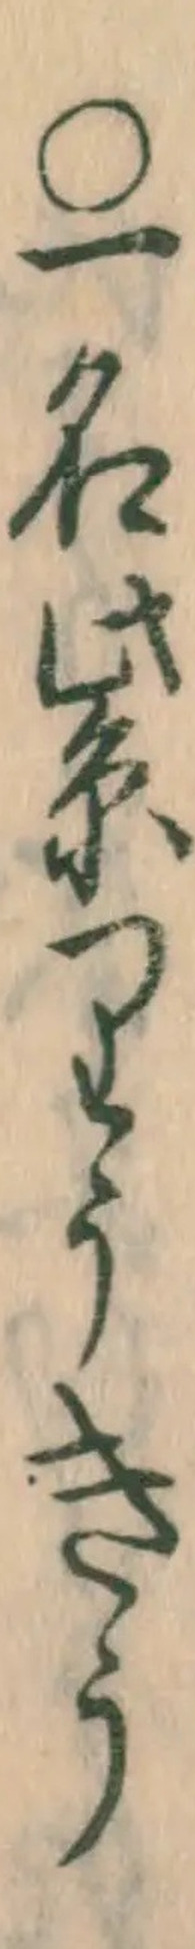○一名紫りうきう
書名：錦繍枕 5巻. [2]
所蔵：国立国会図書館 National Diet Library, JAPAN
